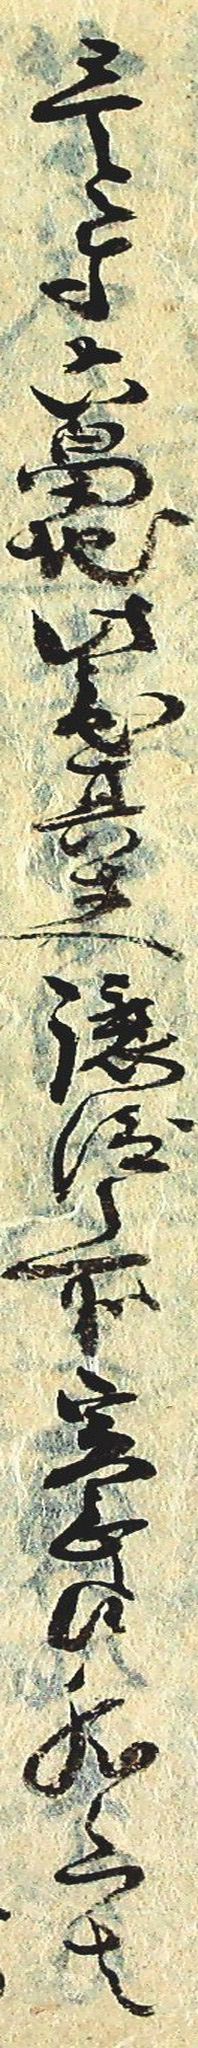有之に付右畠地此度其方へ譲渡申所実正に候然上は
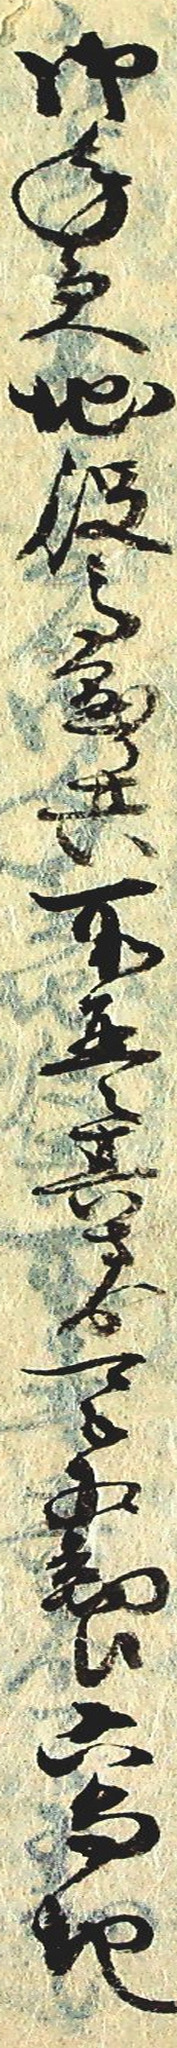御年貢地役高懸り共所並に其方ゟ可被相勤候右畠地
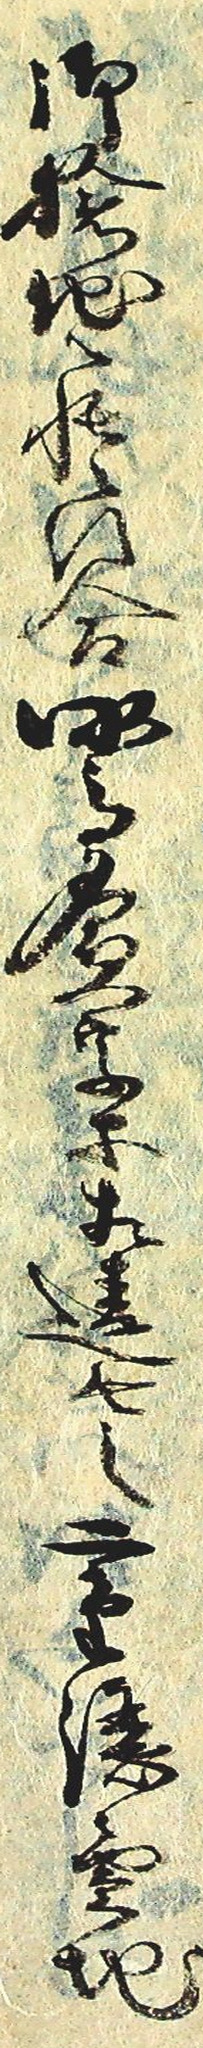御検地御帳に引合畝高名負字等相違無之二重譲売地
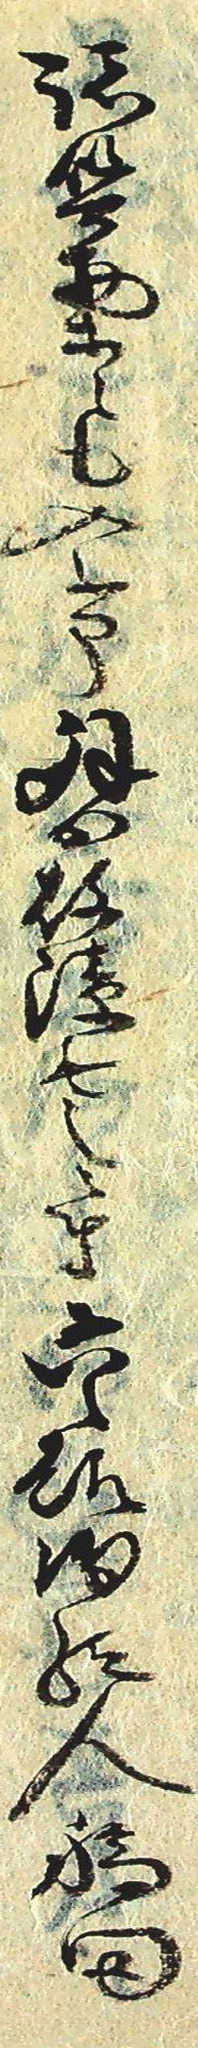諸質物等にも入不申外ゟ故障無之に付右之趣御給人稲田
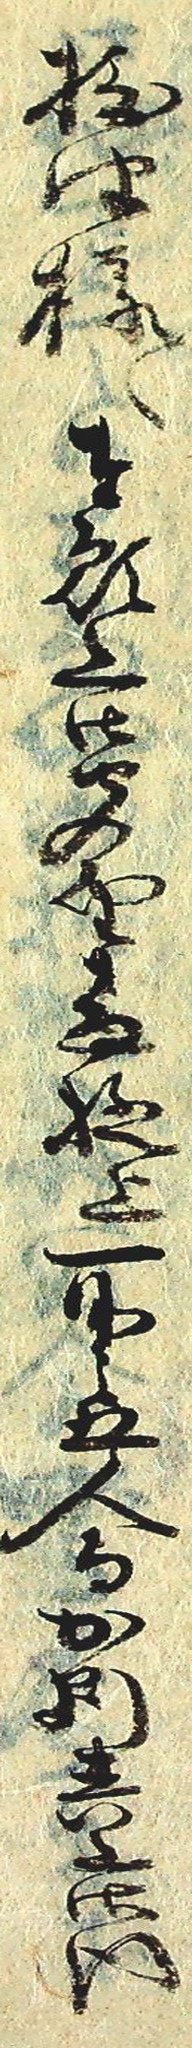摂津様へ奉願上御聞届被為遊上所之五人与加判其上御内
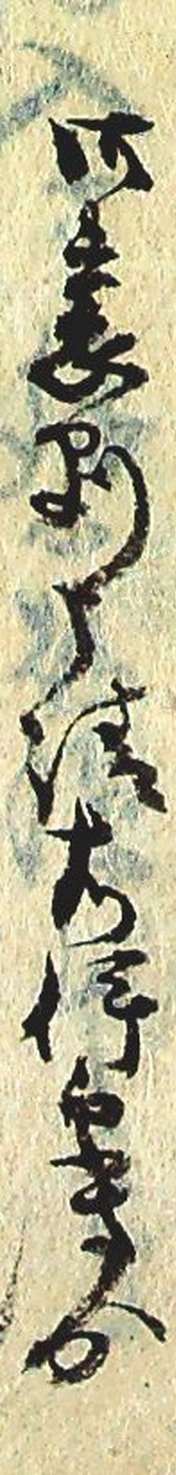御裏判申請右伊兵衛方ゟ
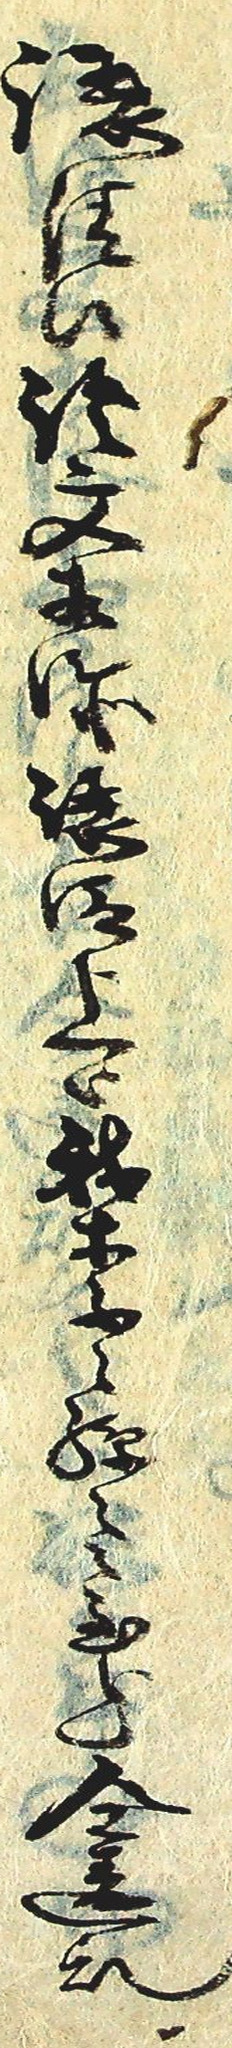譲請候証文相添譲渡申上は我等子々孫々に至迄全違乱
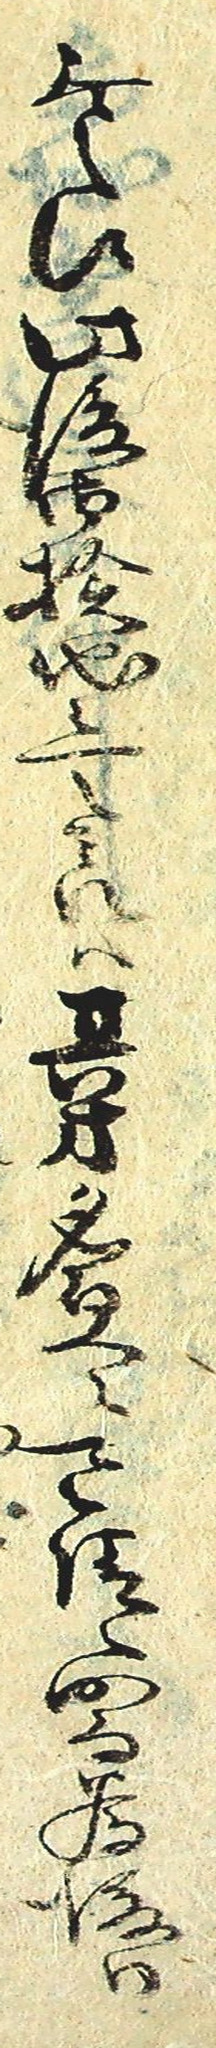無之候此後御検地有之節は其方名負に可被請候仍て為後日
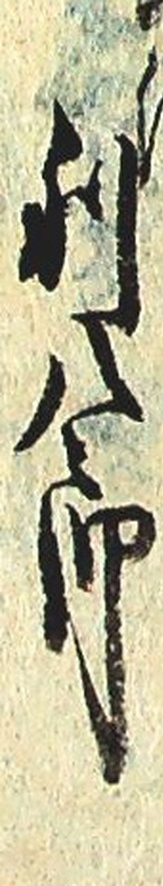利八郎
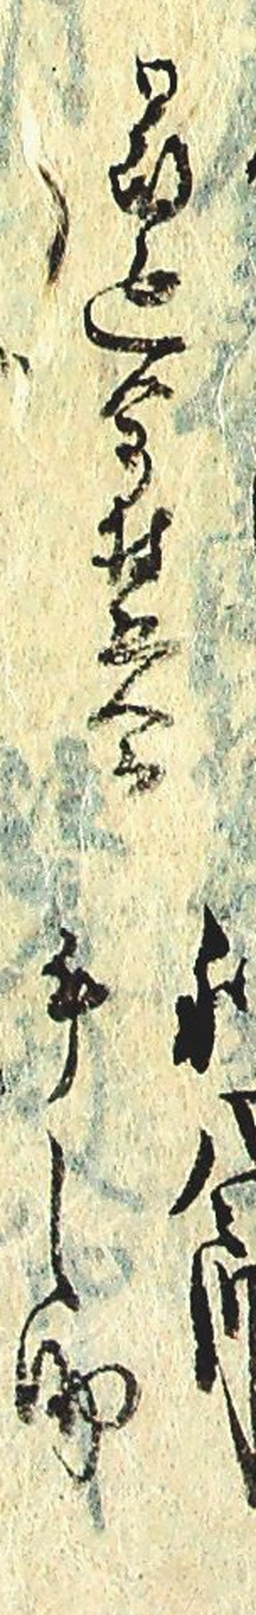同郡延命村五人与牛之助
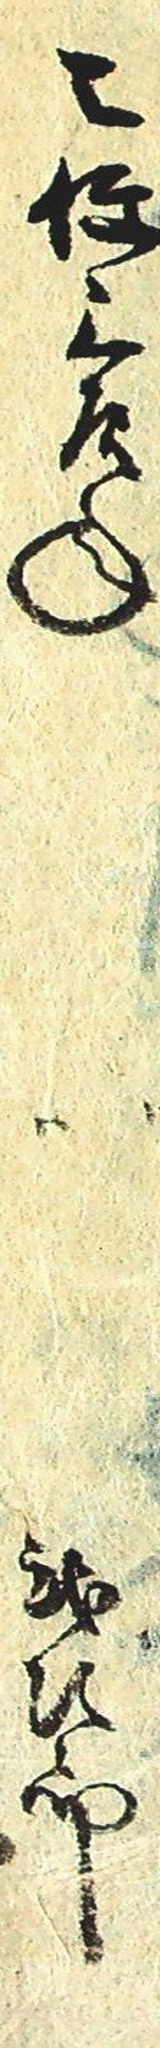天保三辰年同武次郎
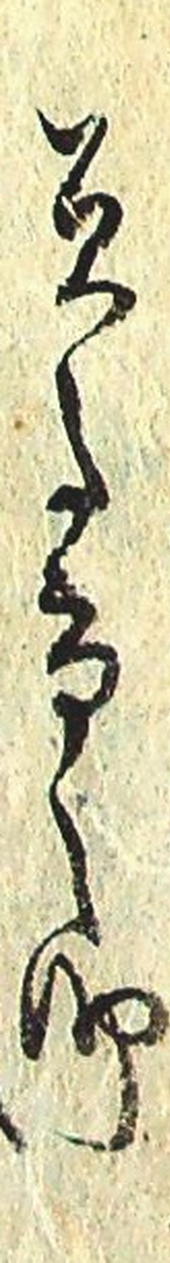兼子市之助

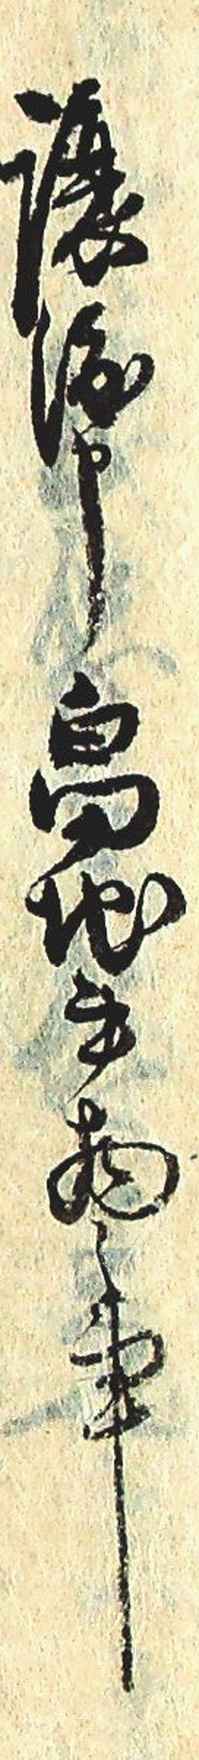売渡申畠地書物之事
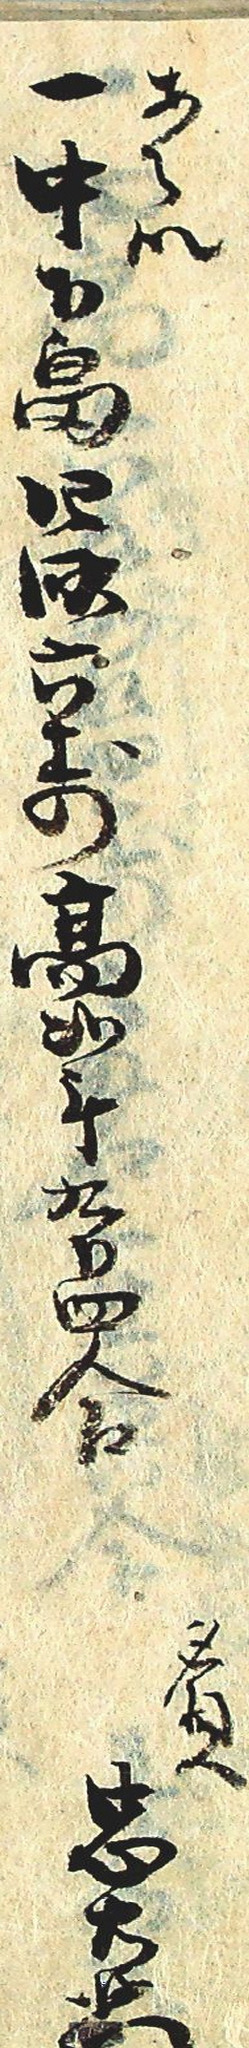一中下畠四畝六歩高弐斗九升四合忠右衛門
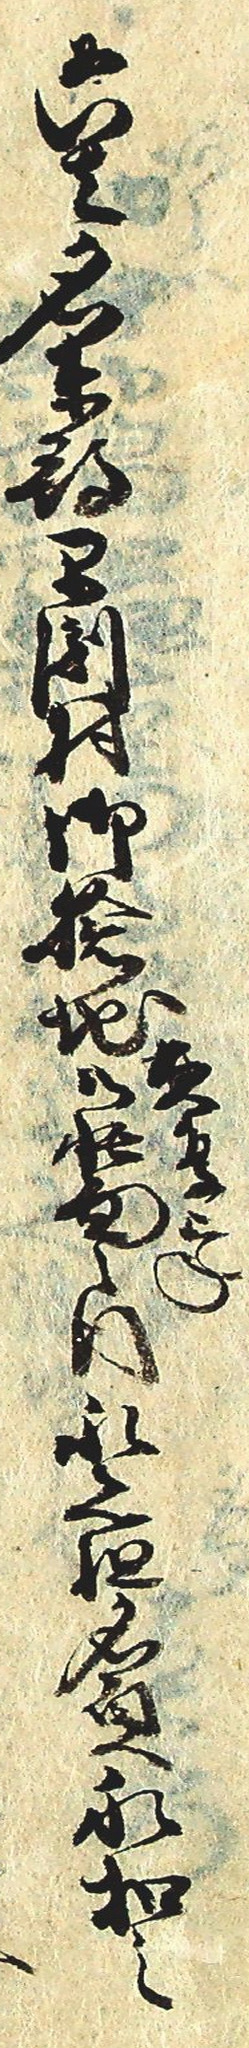右は名東郡早淵村御検地貞享三年御帳面之内私先祖名負私扣之
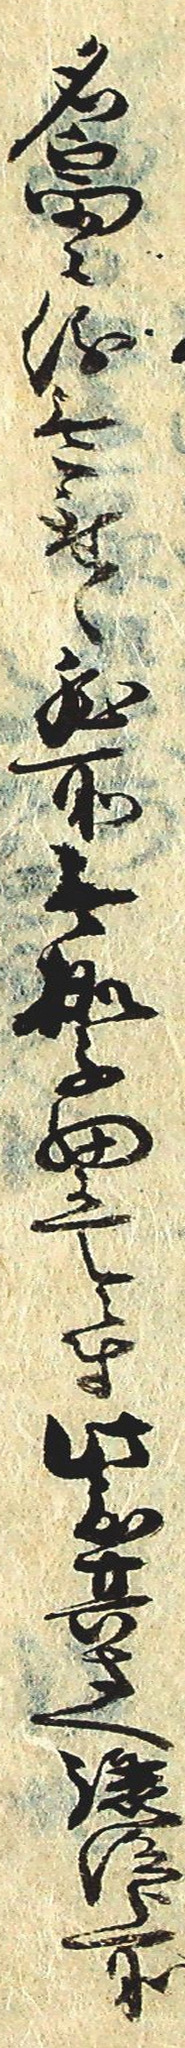名畠に紛無御座候然所無拠子細有之に付此度其方へ譲渡申所
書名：諸御願書控(弐番）
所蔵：鳴門教育大学 Naruto University of Education
